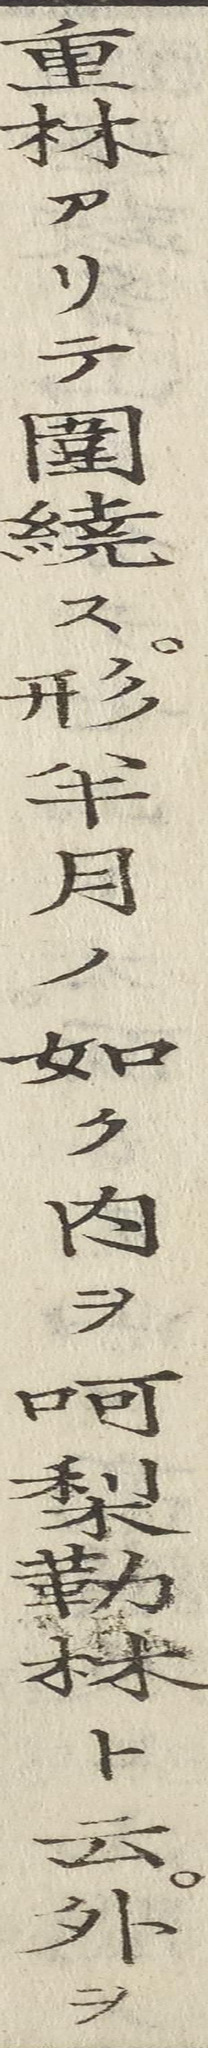重林アリテ囲繞ス。形半月ノ如ク内ヲ呵梨勒林ト云。外ヲ
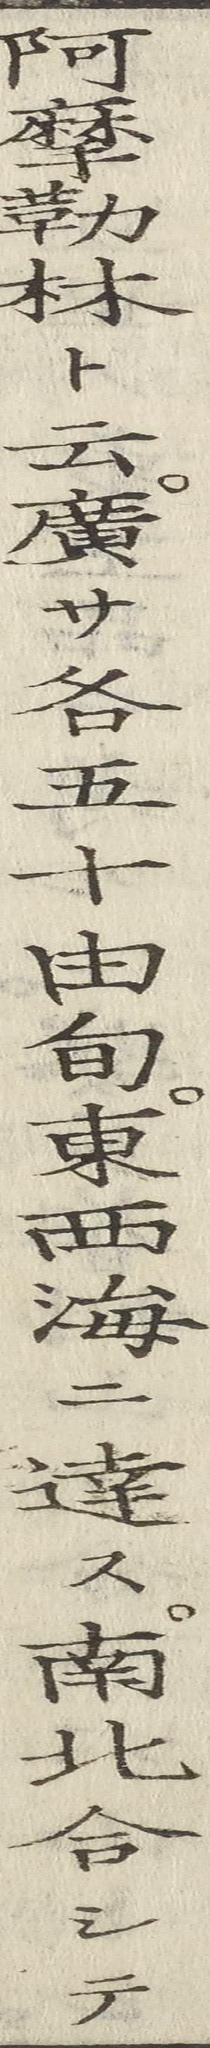阿摩勒林ト云。広サ各五十由旬。東西海ニ達ス。南北合シテ
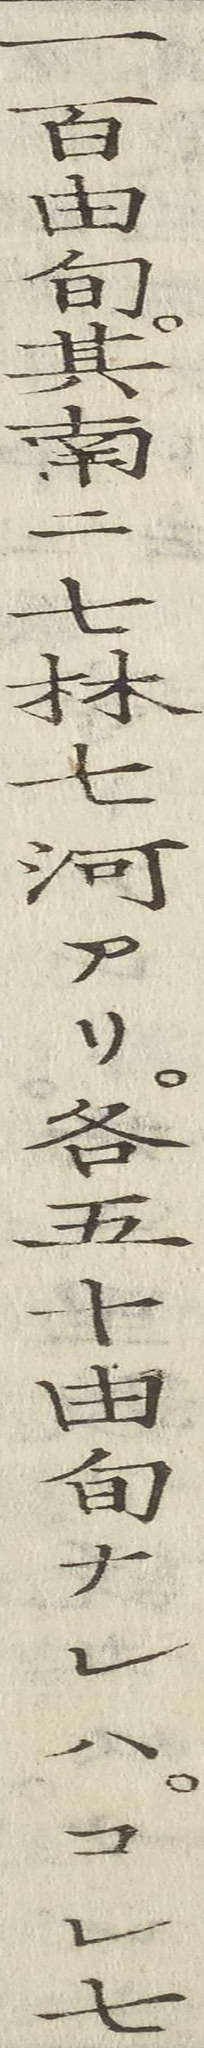一百由旬.其南ニ七林七河アリ。各五十由旬ナレハ。コレ七
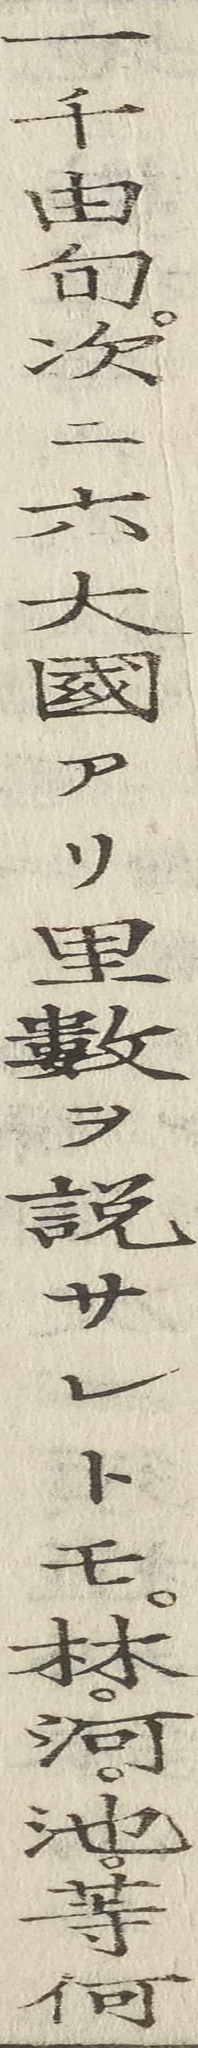一千由旬。次ニ六大国アリ里数ヲ説サレトモ。林〇河〇池〇等何
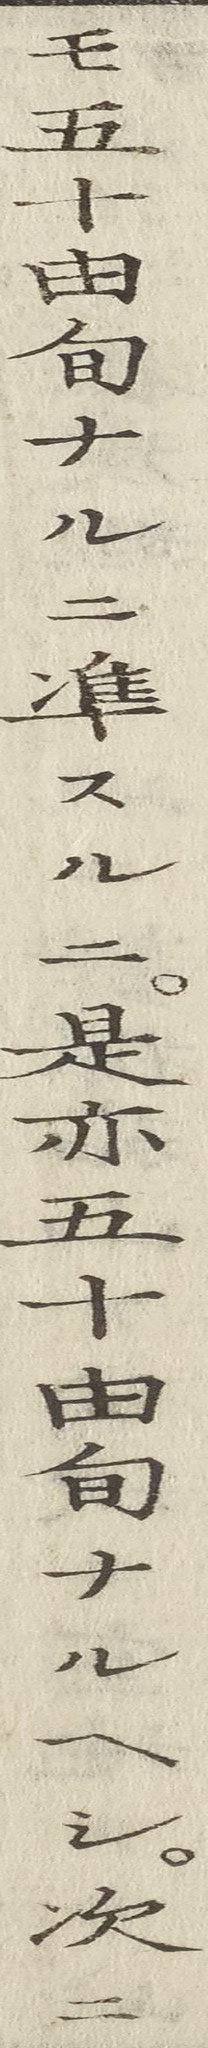モ五十由旬ナルニ準スルニ。是亦五十由旬ナルヘシ。次ニ
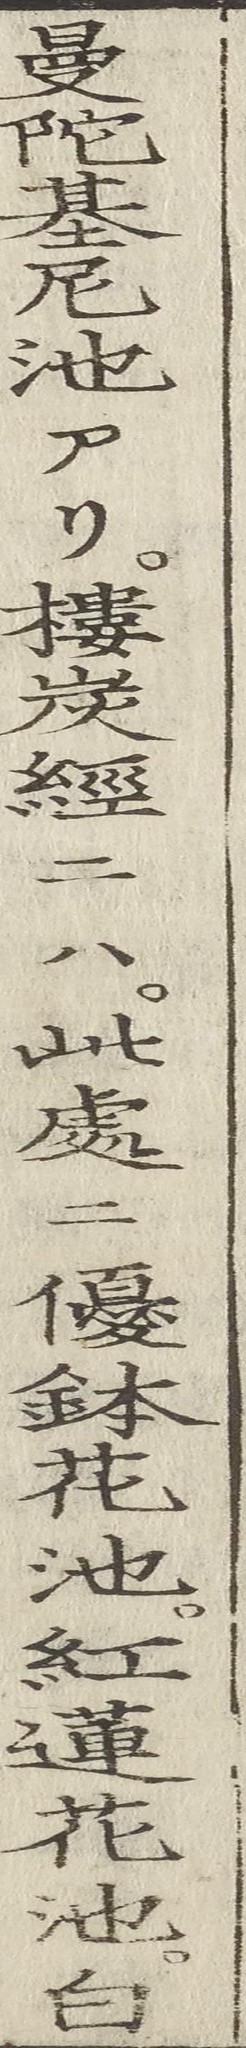曼陀基尼池アリ。楼炭経ニハ。此処ニ優鉢花池。紅蓮花池。白
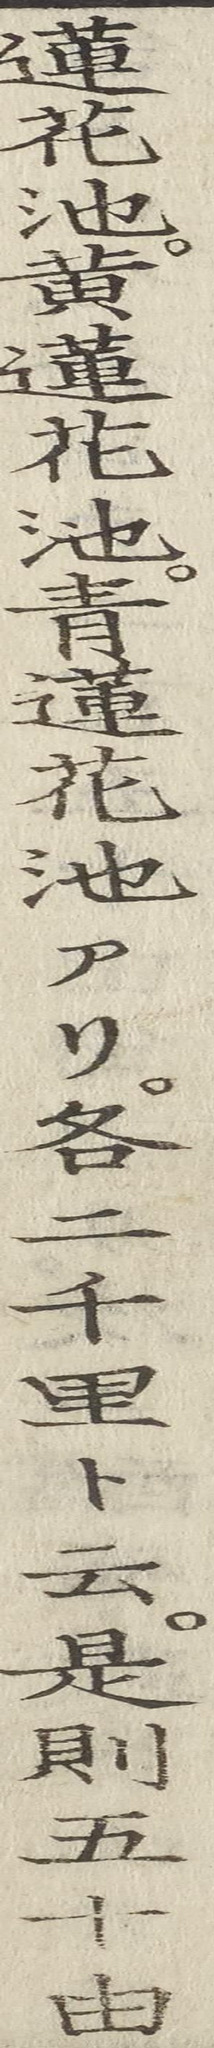蓮花池。黄蓮花池。青蓮花池アリ。各二千里ト云。是則五十由

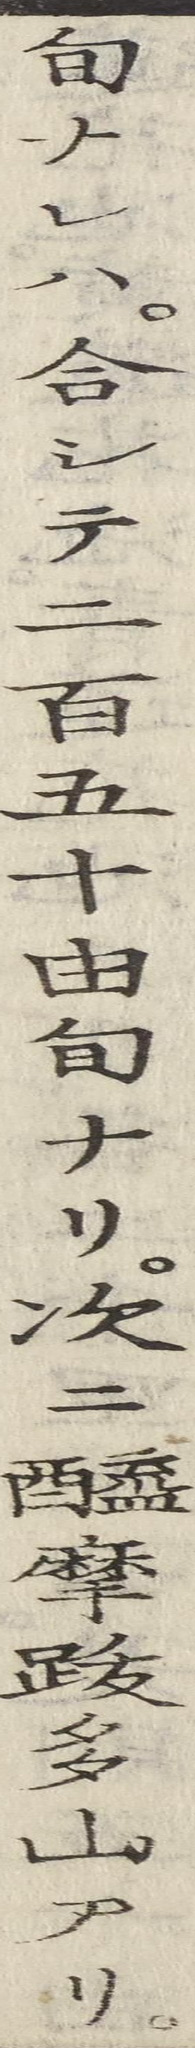旬ナレハ。合シテ二百五十由旬ナリ。次ニ醯摩跋多山アリ。
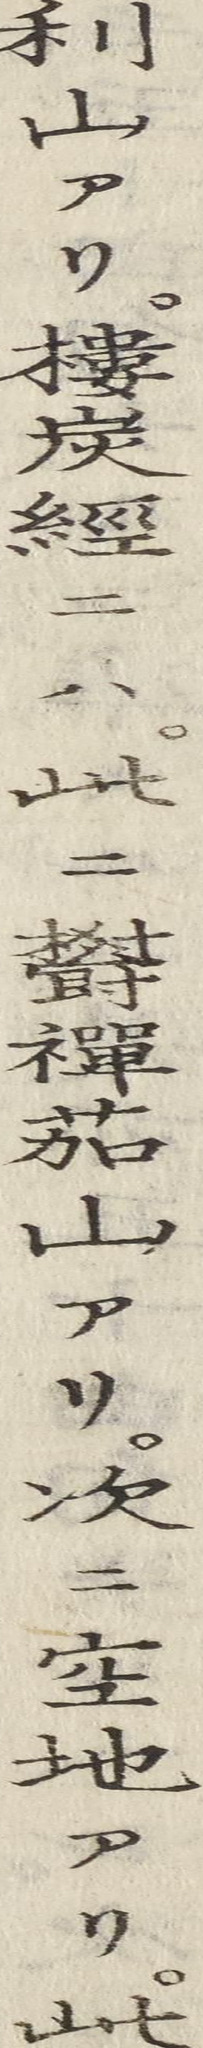利山アリ。楼炭経ニハ。此ニ欝禅茄山アリ。次ニ空地アリ。此
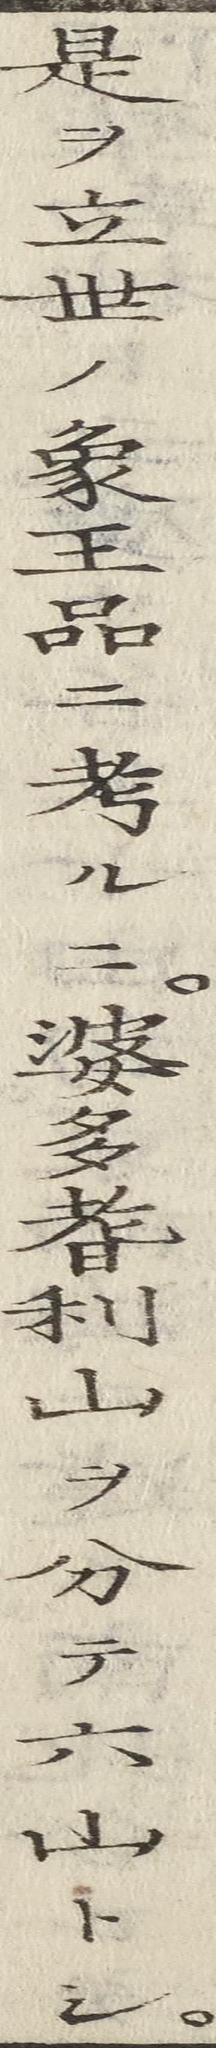是ヲ立世ノ象王品ニ考ルニ。婆多耆利山ヲ分テ六山トシ。
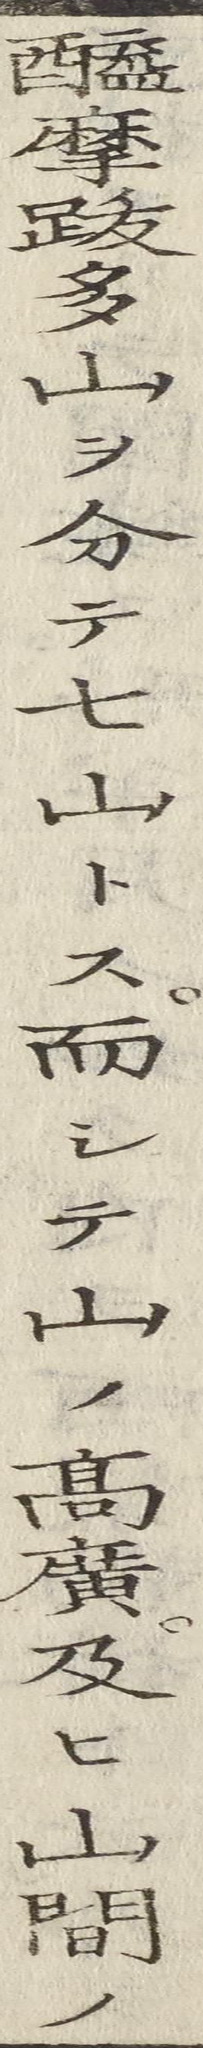醯摩跋多山ヲ分テ七山トス。而シテ山ノ高広。及ヒ山間ノ
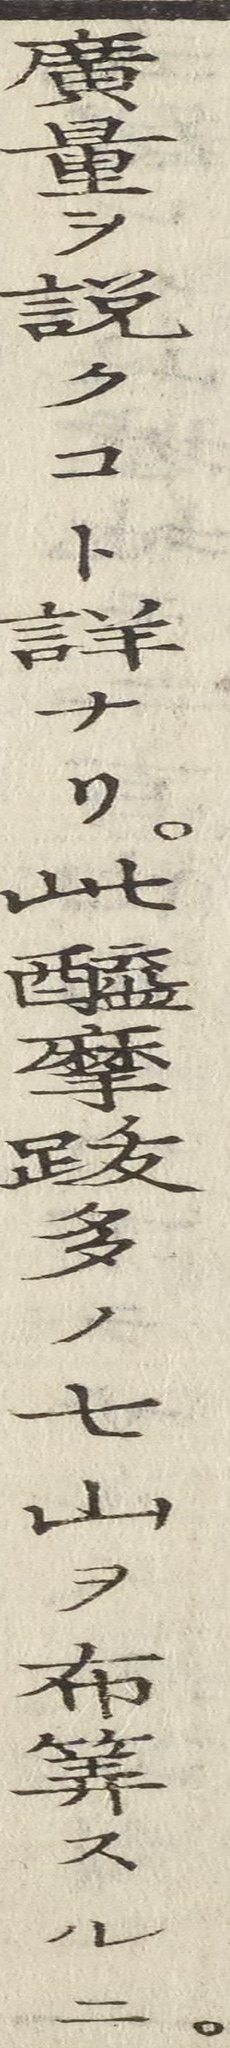広量ヲ説クコト詳ナリ。此醯摩跋多ノ七山ヲ布筭スルニ。
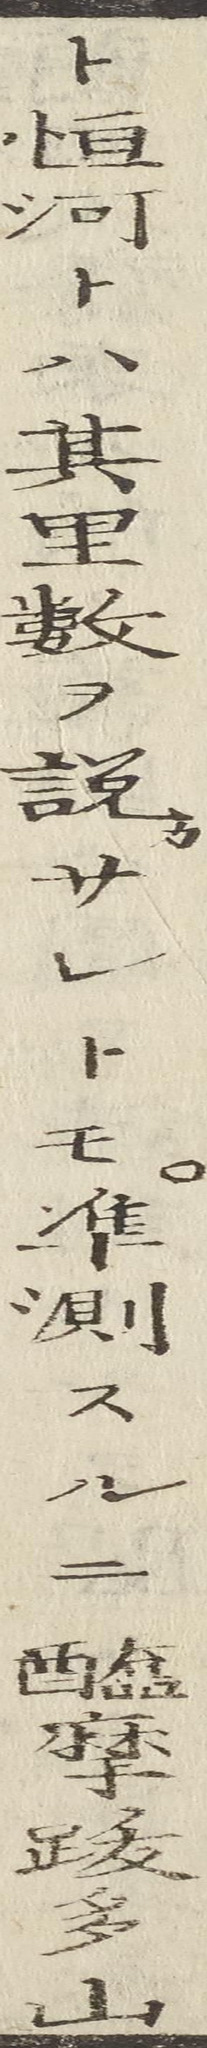ト恒河トハ其里数ヲ説。準測スルニ醯摩跋多山
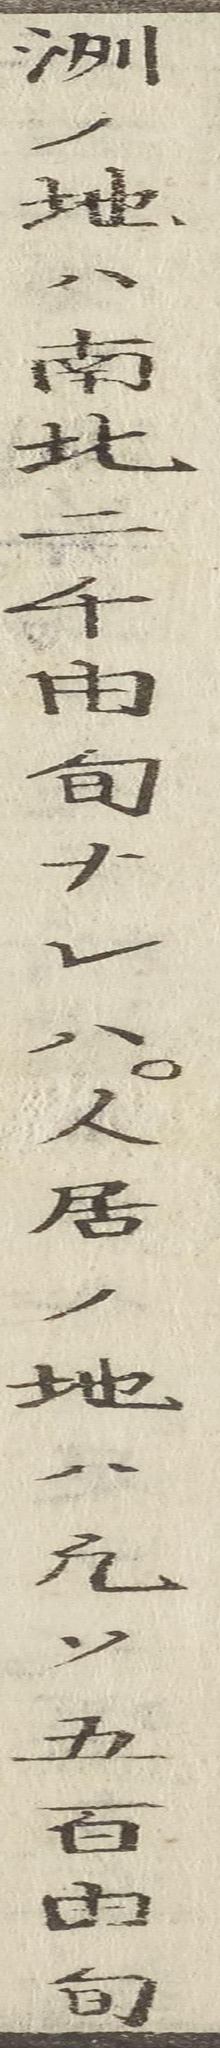洲ノ地ハ南北二千由旬ナレハ。人居ノ地ハ凡ソ五百由旬
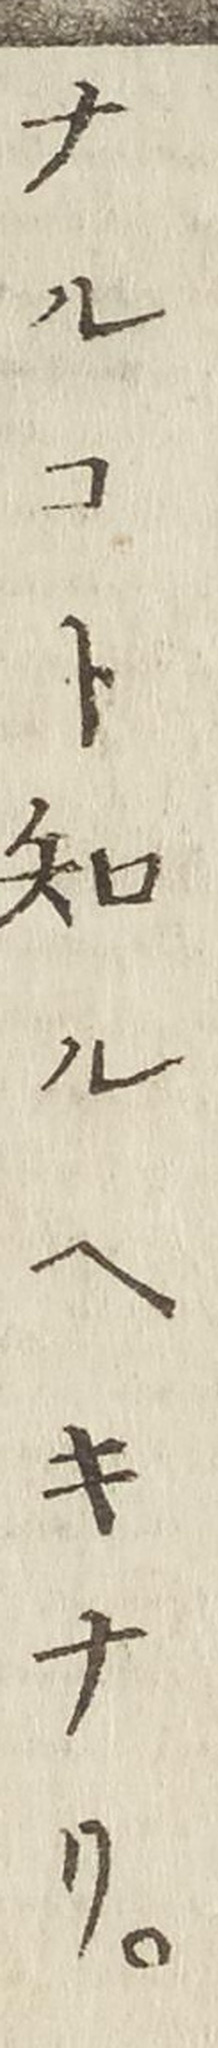ナルコト知ルヘキナリ。
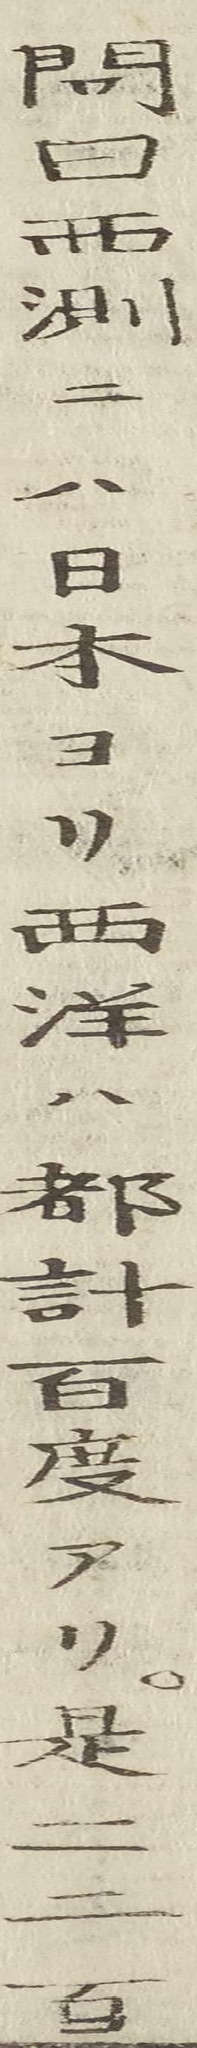問曰西洲ニハ日本ヨリ西洋ハ都計百度アリ。是ニ二百
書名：護法新論　二編　中
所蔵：東京大学地震研究所図書室 Earthquake Research Institute Library, The University of Tokyo, JAPAN
